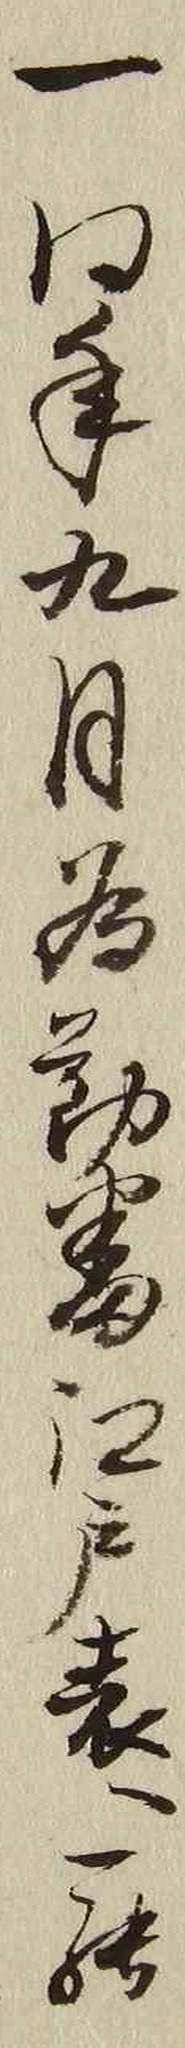一同年九月為勤番江戸表へ罷
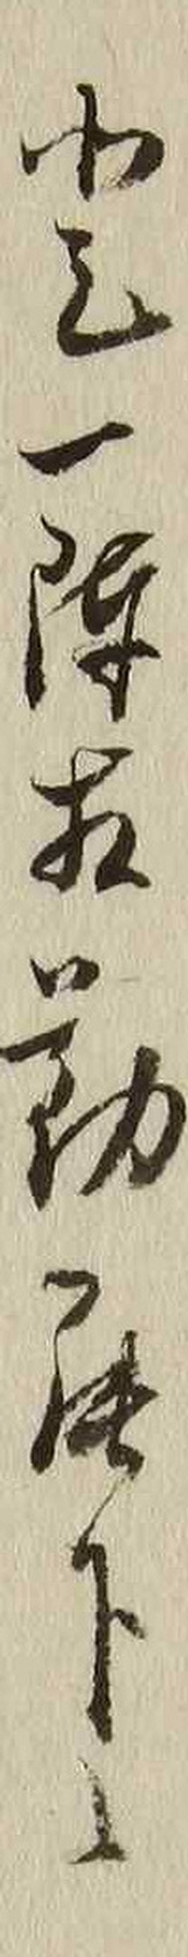登一陣相勤罷下候
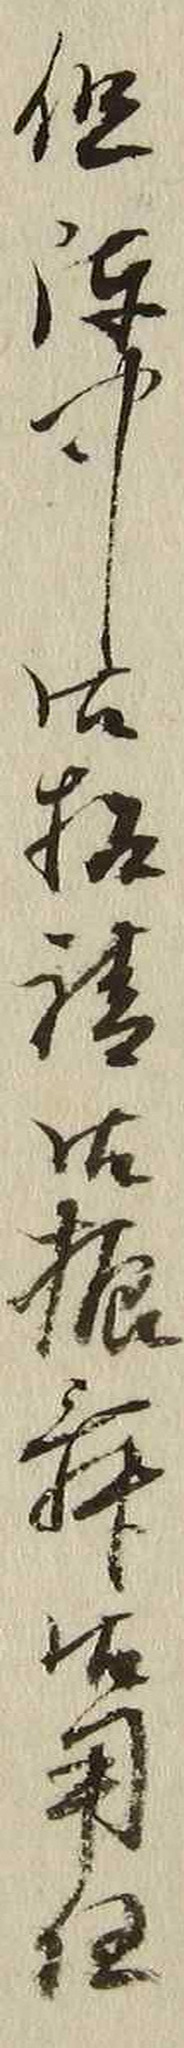但陣中御招請御振舞御用任
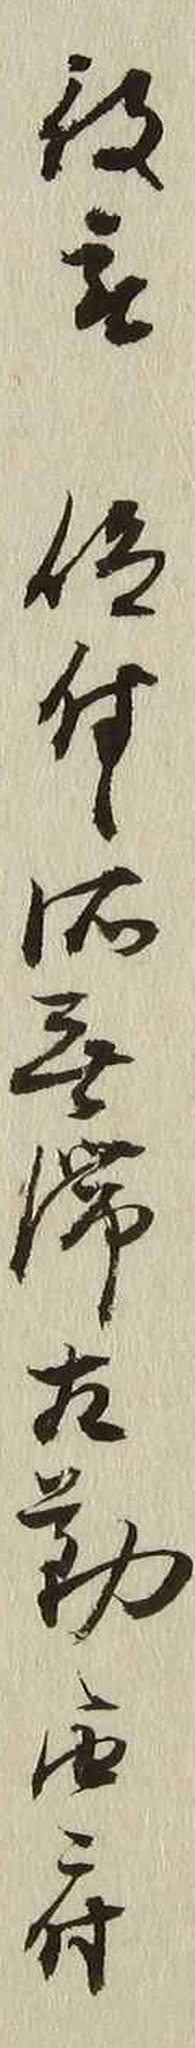役被仰付候所無滞相勤候由ニ付
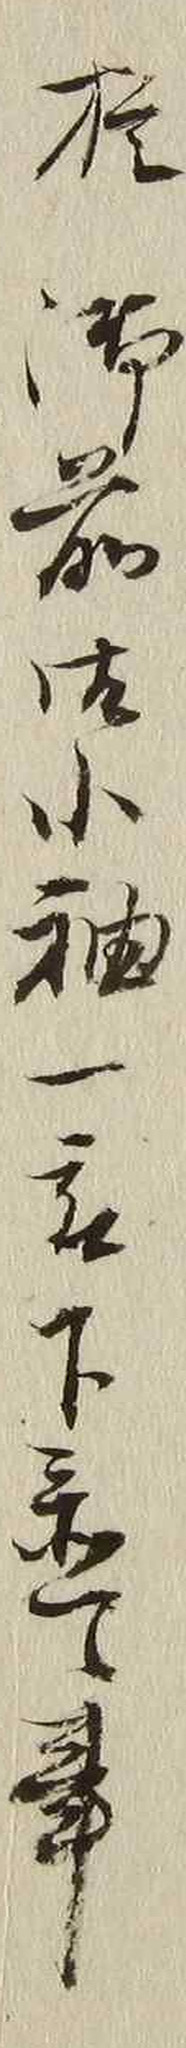於御前御小袖一被下置候事
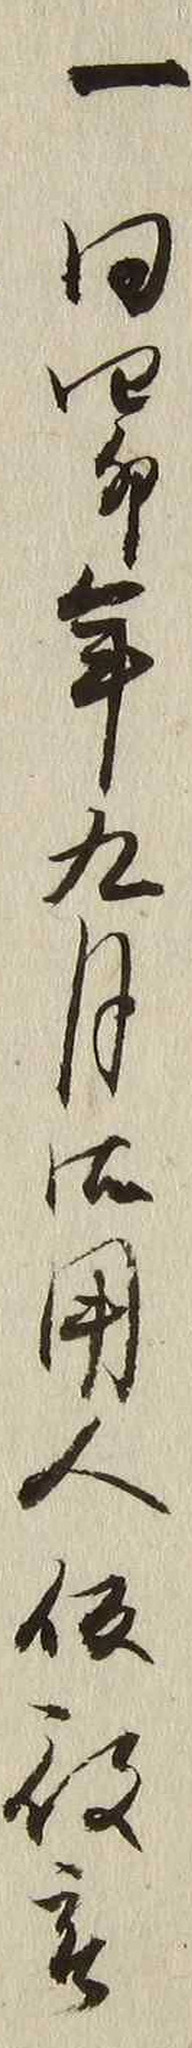一同四卯年九月御用人仮役被
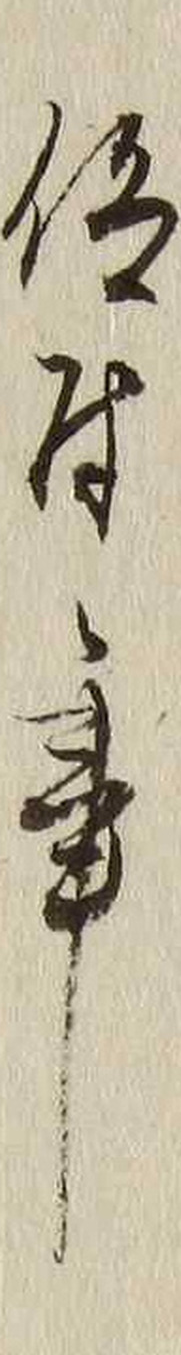仰付候事
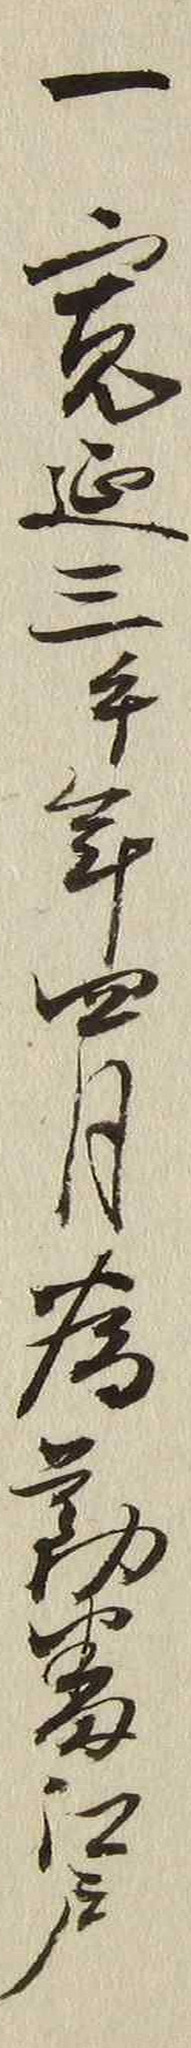一寛延三午年四月為勤番江戸
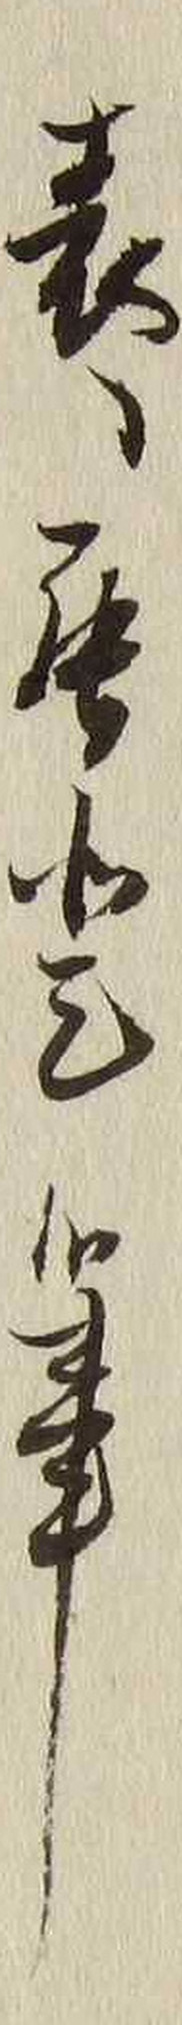表へ罷登候事
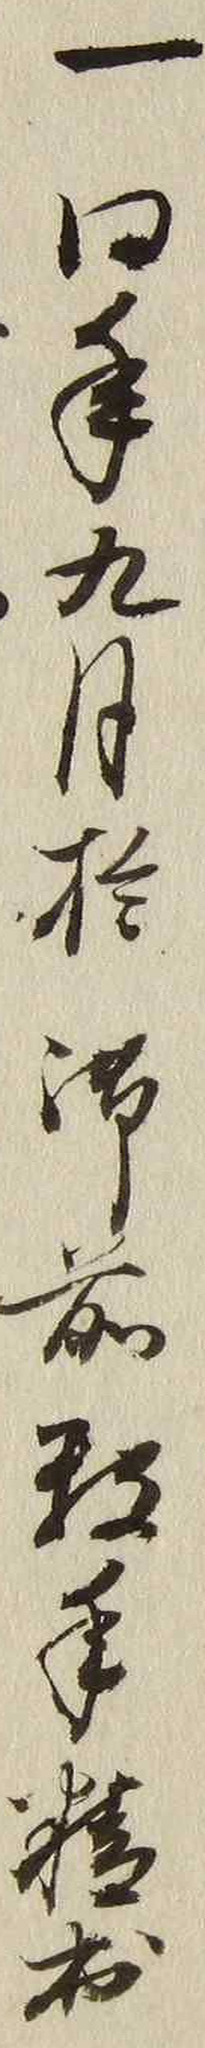一同年九月於御前数年精出
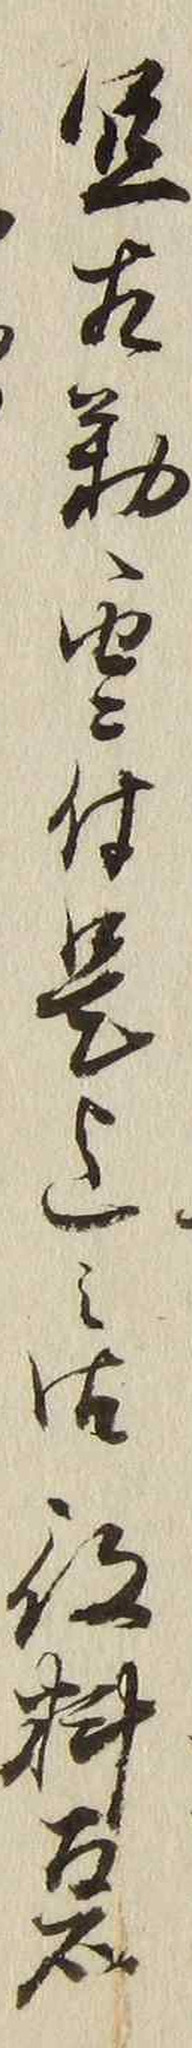宜相勤候由ニ付是迄之御役料百石
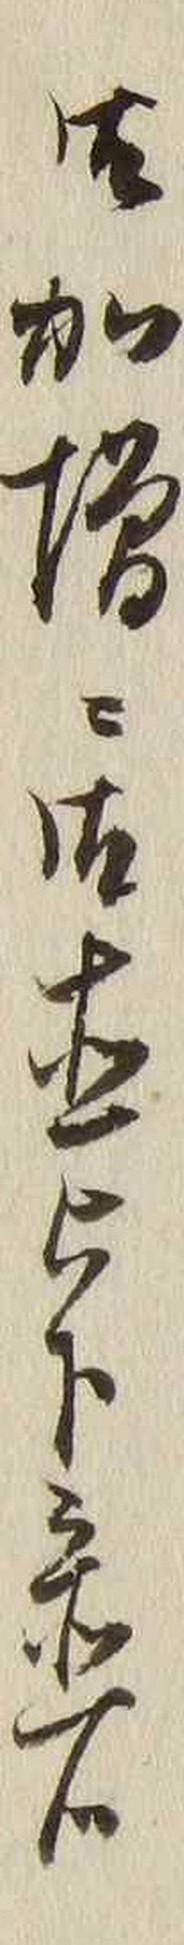御加増ニ御直被下置候
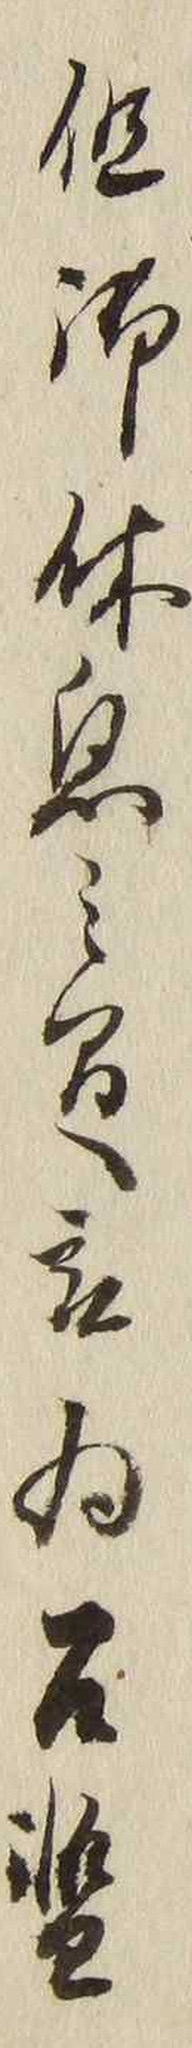但御休息之間へ被為召暫

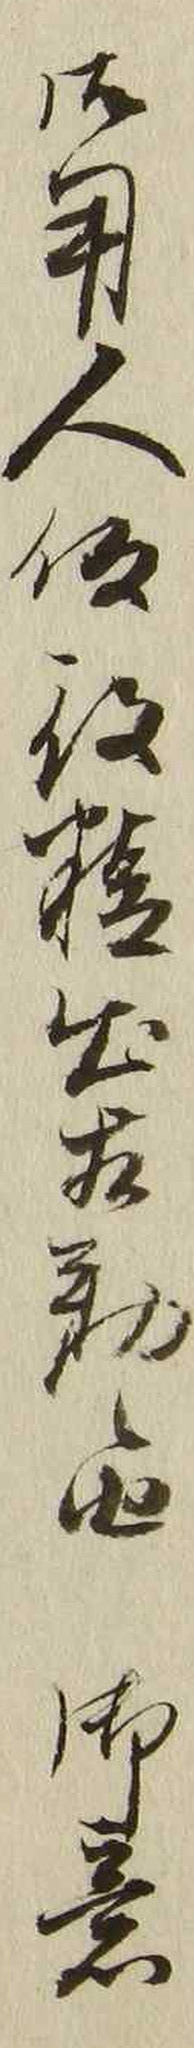御用人仮役精出相勤候由御意
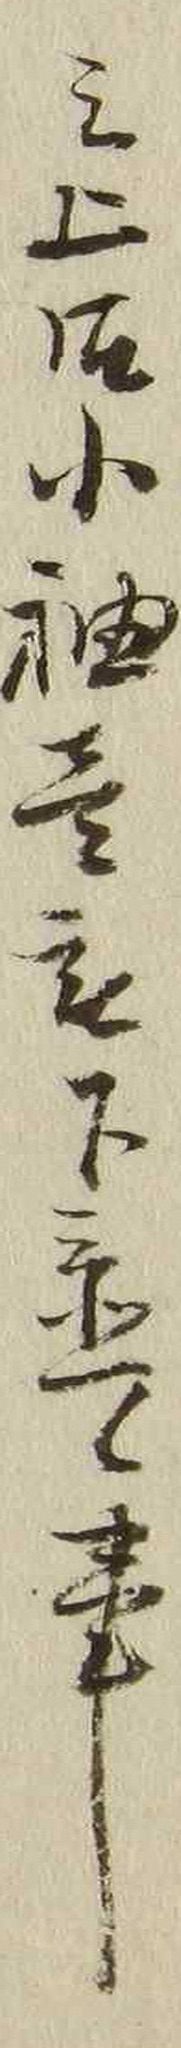之上御小袖壱下置候事
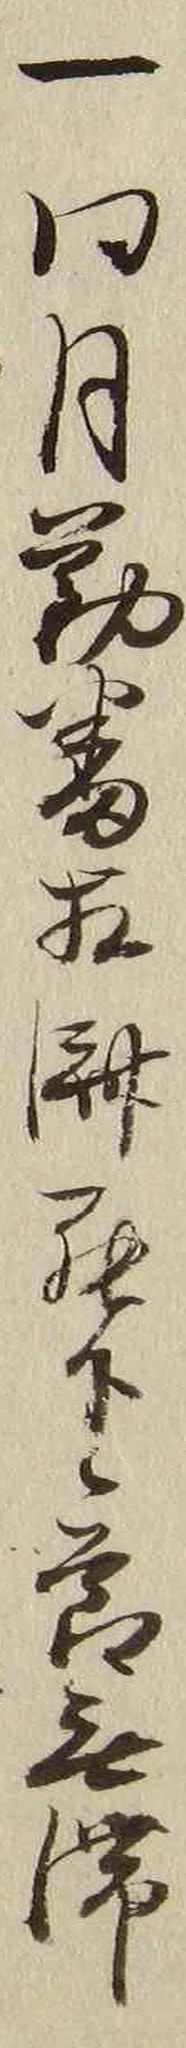一同月勤番相済罷下候節無滞
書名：諸士系譜　巻之348　も之部4
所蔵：会津若松市立会津図書館
